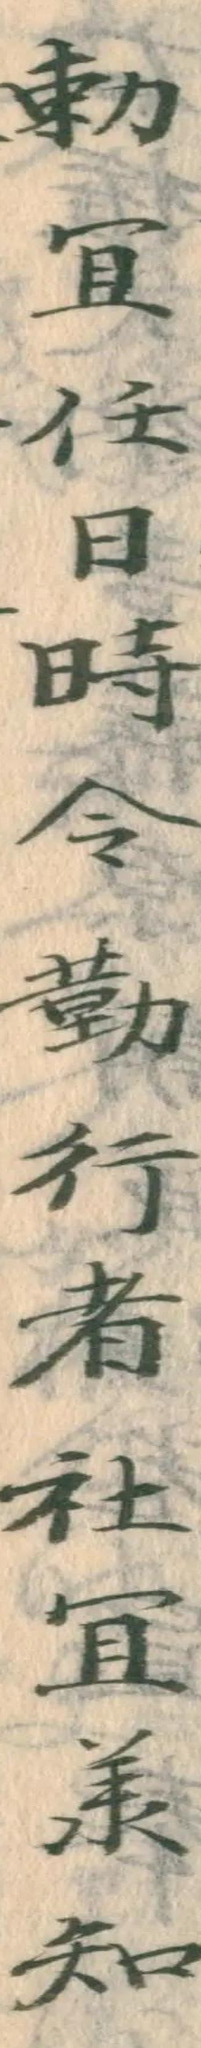勅宜任日時令勤行は社宜承知
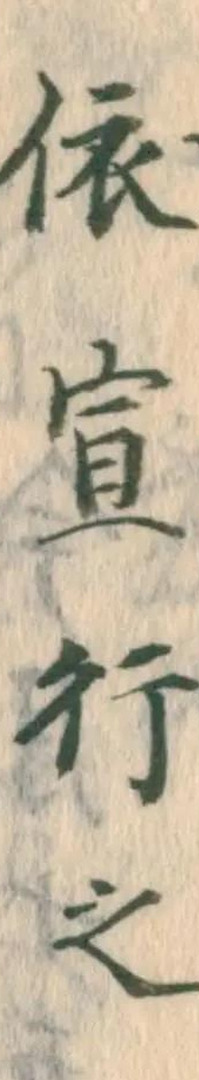依宣行之
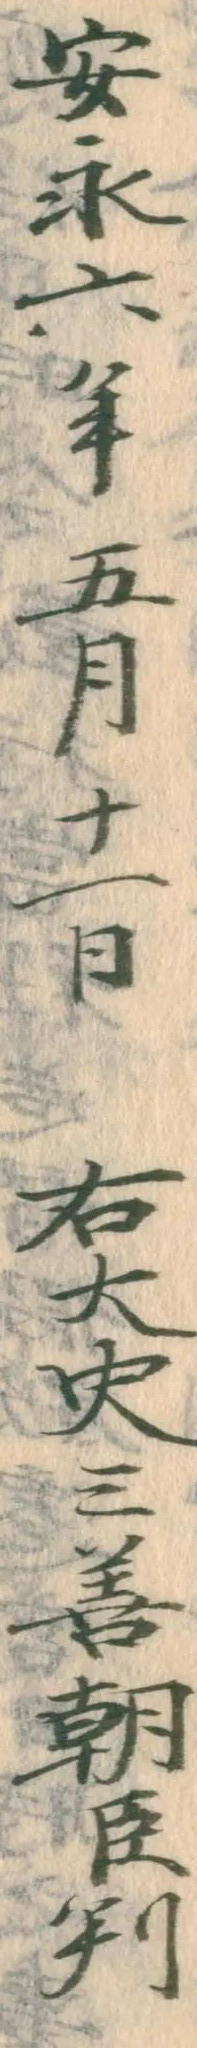安永六年五月十一日右大史三善朝臣判
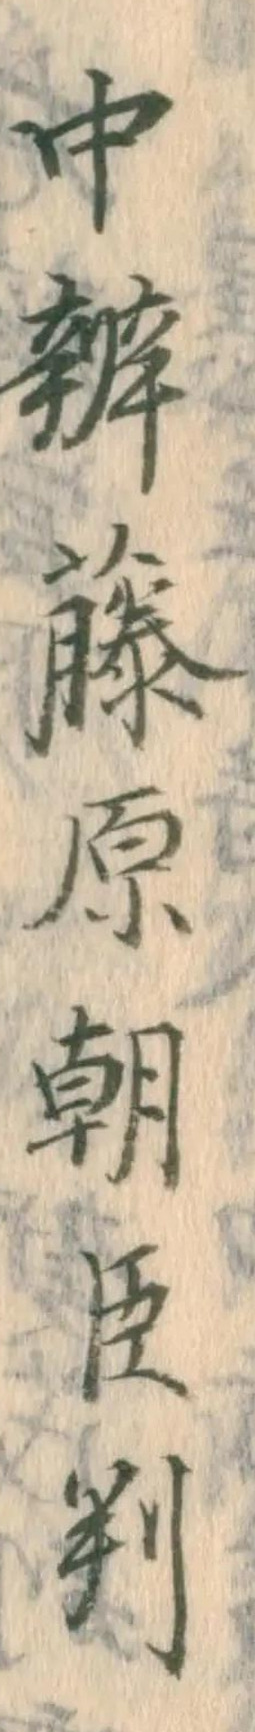中弁藤原朝臣判
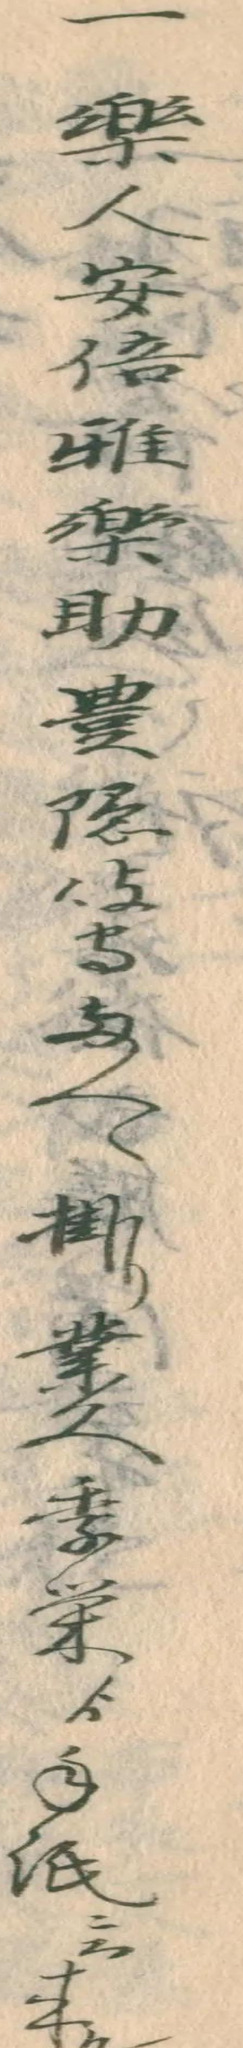一楽人安倍雅楽助豊隠岐守両人へ掛リ業久季栄ゟ手紙ニ而来ル
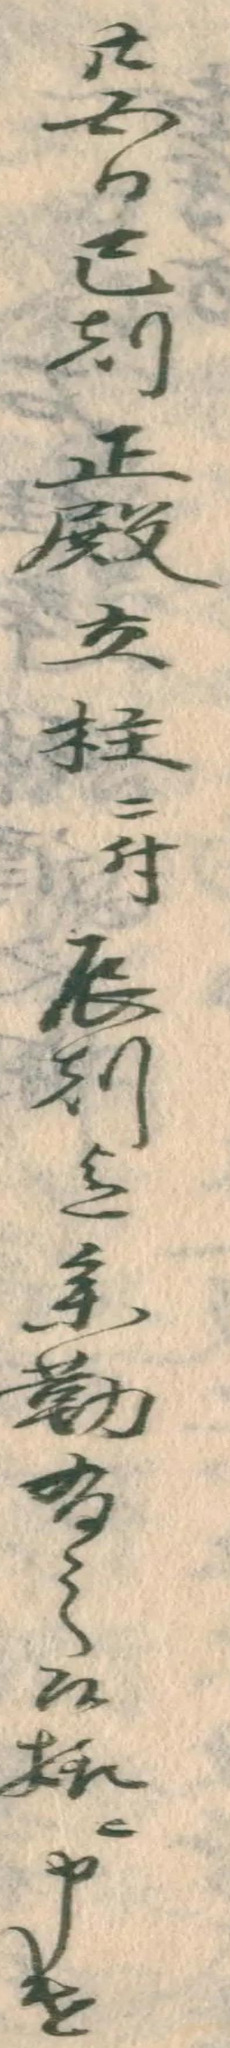廿五日巳刻正殿立柱ニ付辰刻迄参勤有之候様ニ申遣
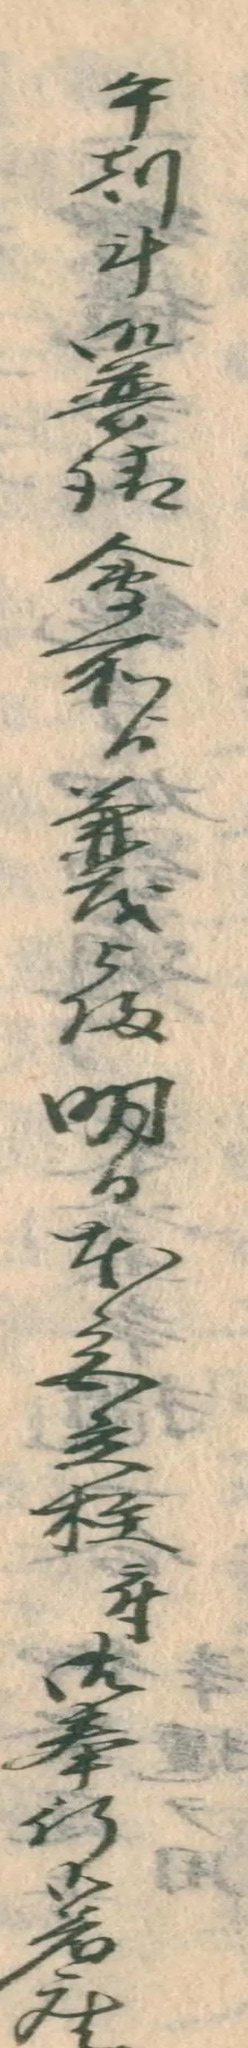一午刻計御普請会所ゟ兼茂被備明日本宮立柱ニ付御奉行御着座
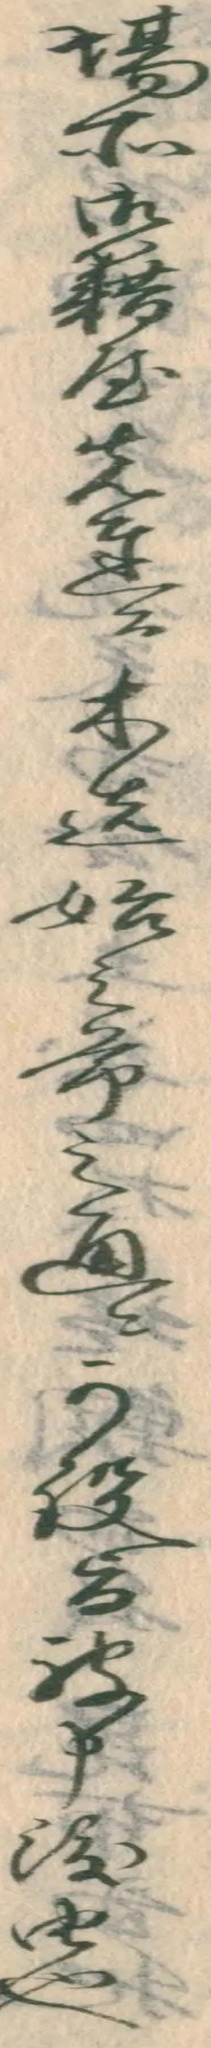場所御籍屋先達而木造始之節之通ニ可設旨被申渡由也
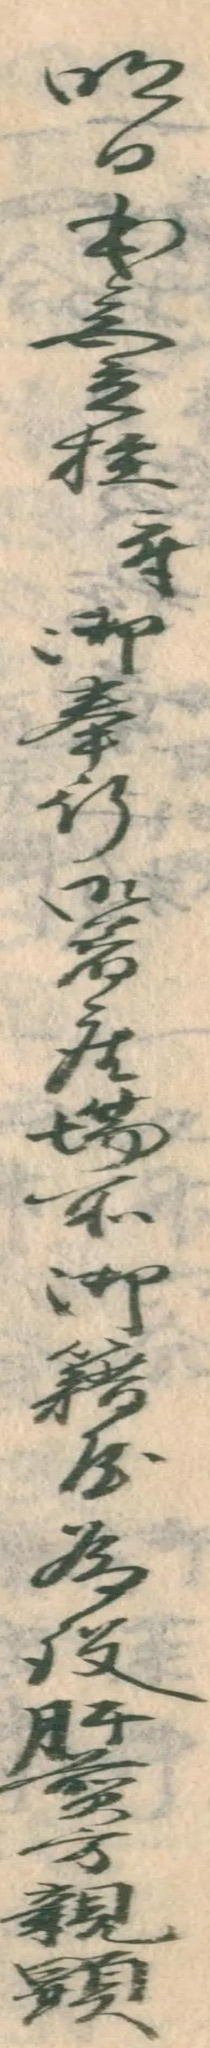一明日本宮立柱ニ付御奉行御着座場所御籍屋為設肝煎方親顕
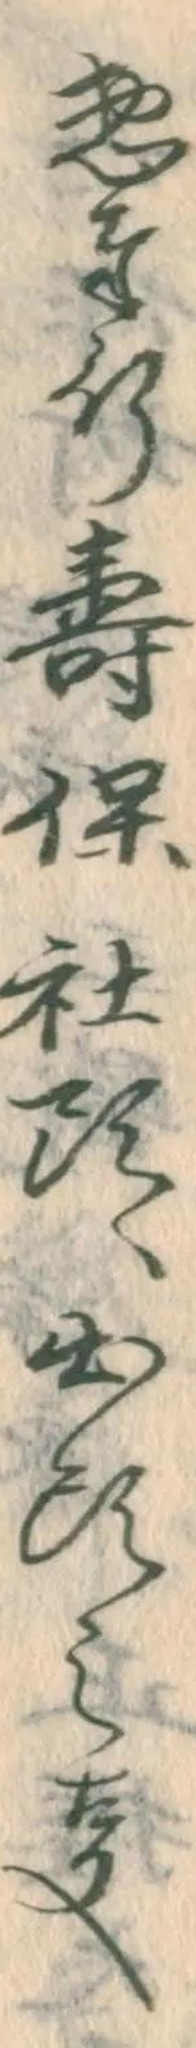惣奉行寿保社頭へ出頭之事
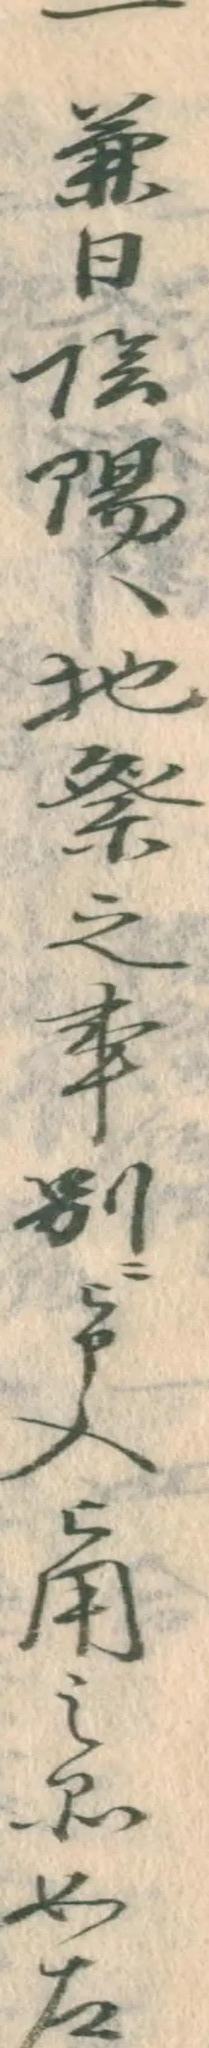一兼日陰陽へ地祭之事別ニ被申入被用之品如左

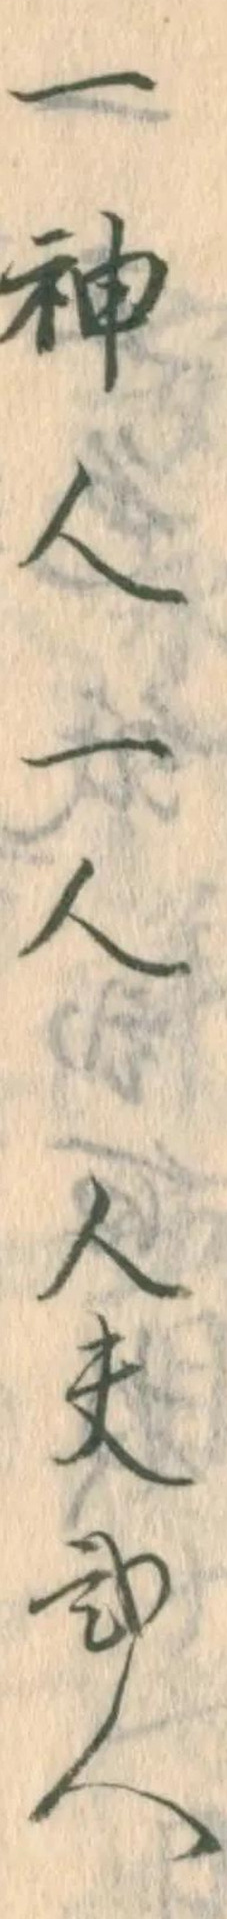一神人一人人夫弐人
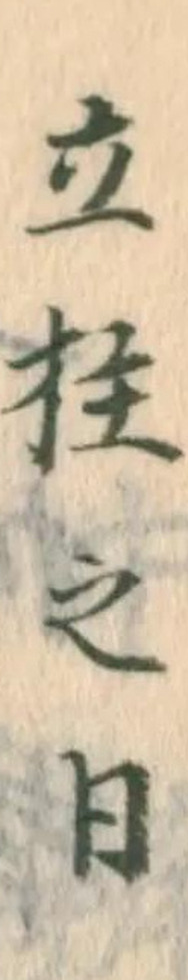立柱之日
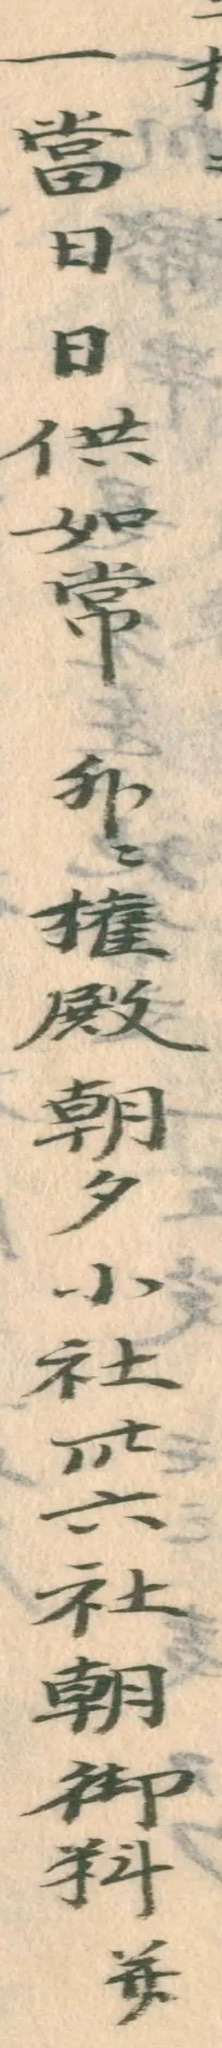一当日日供如常外ニ権殿朝夕小社卅六社朝御料并
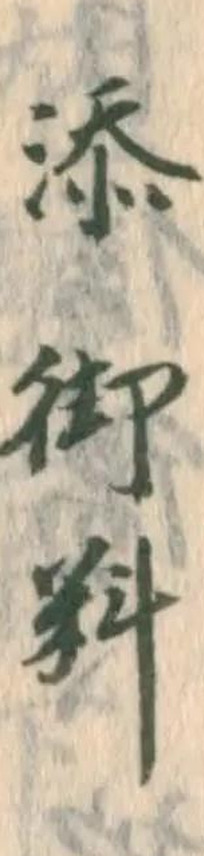漆御料
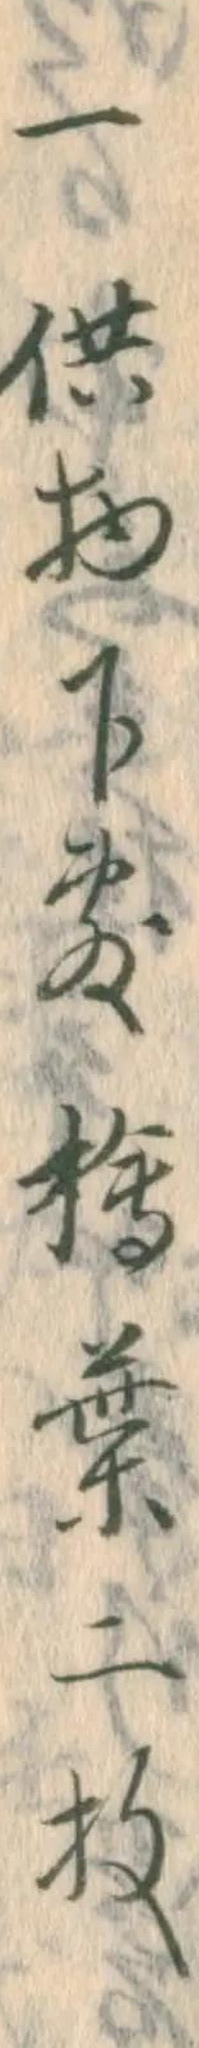一供物下敷檜葉二枚
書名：賀茂社記録. 第17冊
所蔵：国立国会図書館 National Diet Library, JAPAN
